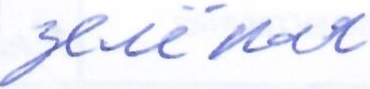зелёная
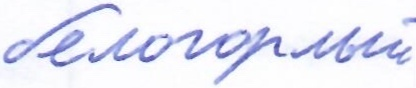белогорлый
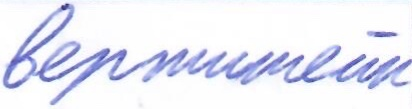вертишейк
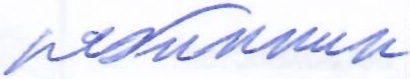рябинник
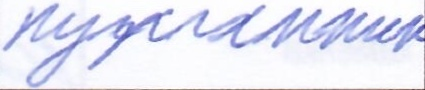курганник
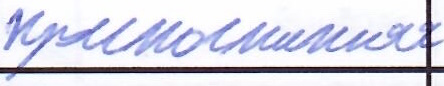красноспинняя
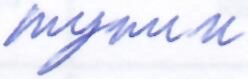тупик
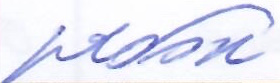рябок
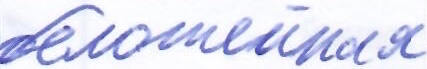белошейная
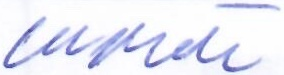синий
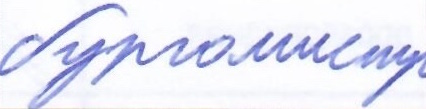бургомистр
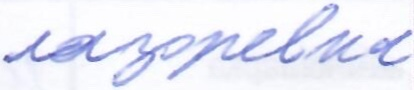лазоревка
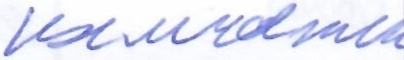камчатск
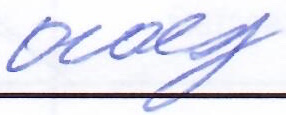осоед
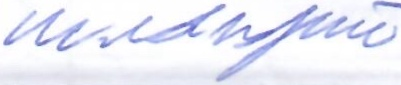исландий
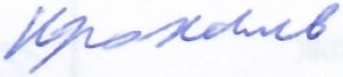крохаль
